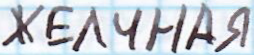желчная
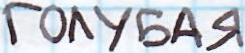голубая
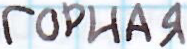горная
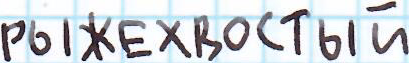рыжехвостый
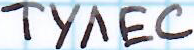тулес
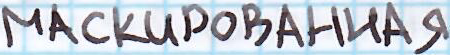маскированная
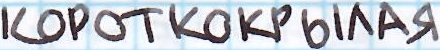короткокрылая
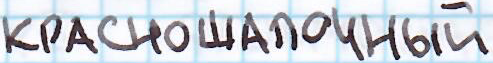красношапочный
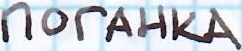поганка
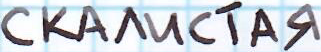скалистая
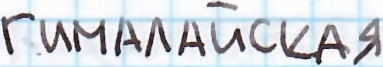гималайская
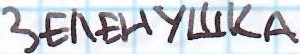зеленушка
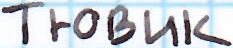тювик
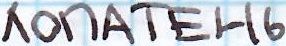лопатень
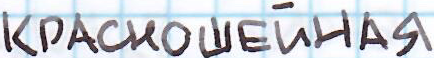красношейная
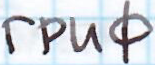гриф
